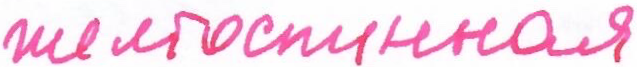желтоспинная
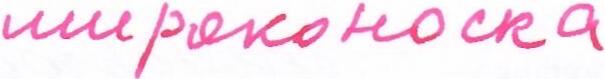широконоска
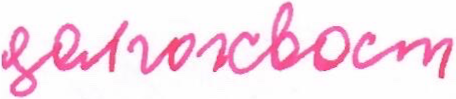долгохвост
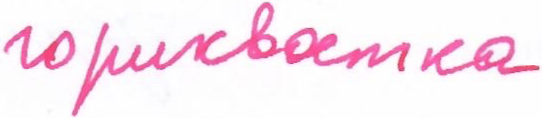горихвостка
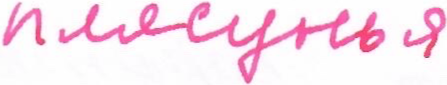плясунья
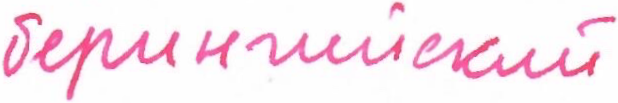берингийский
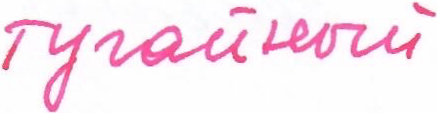тугайный
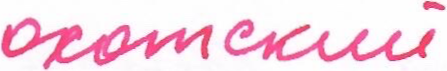охотский
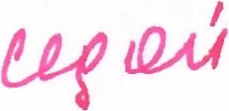седой
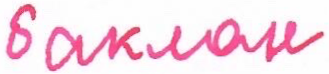баклан
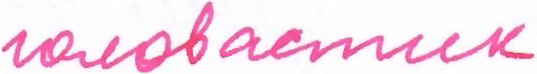головастик
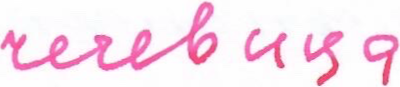чечевица
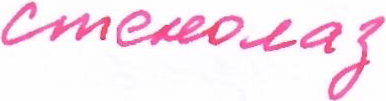стенолаз
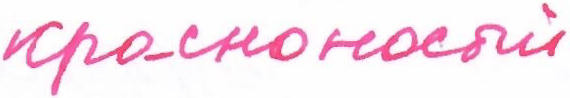красноносый
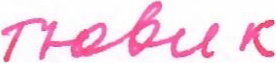тювик
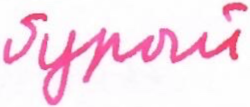бурый
